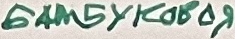бамбуковая
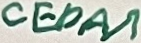серая
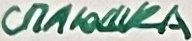сплюшка
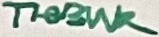тювик
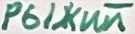рыжий
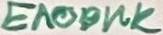еловик
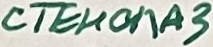стенолаз
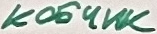кобчик
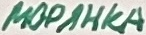морянка
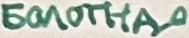болотная
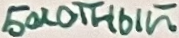болотный
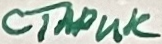старик
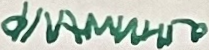фламинго
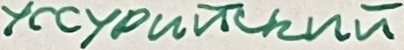уссурийский
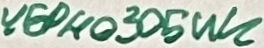чернозобик
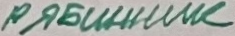рябинник
